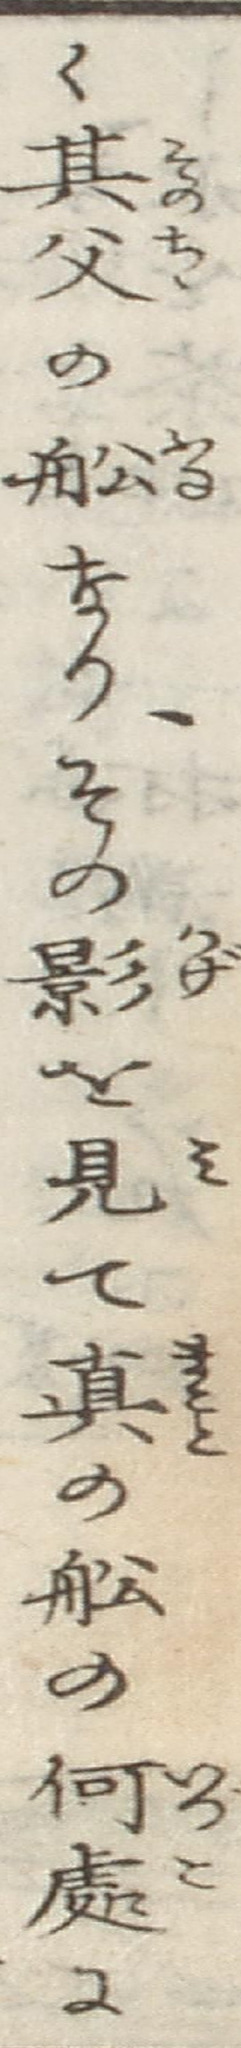く其父の船なり、その影を見て真の船の何処に
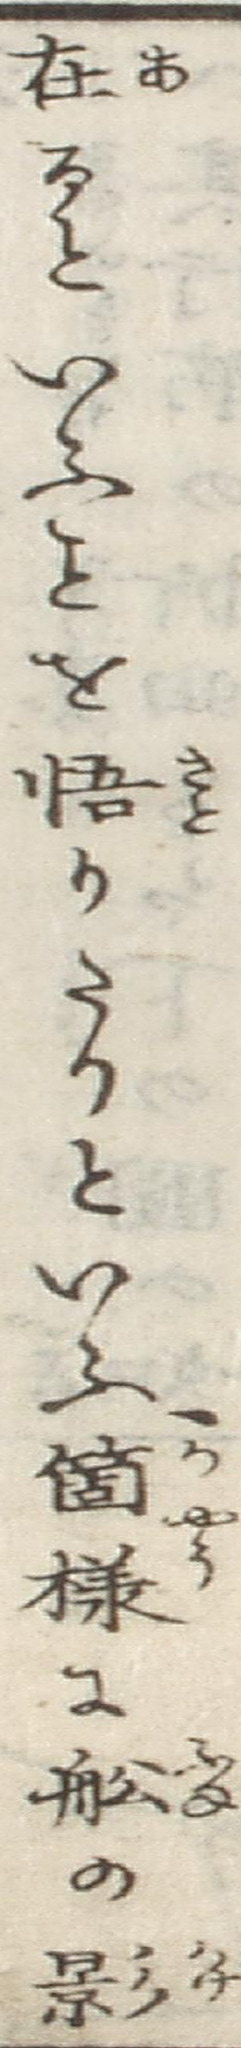在るといふことを悟りたりといふ、箇様に船の影
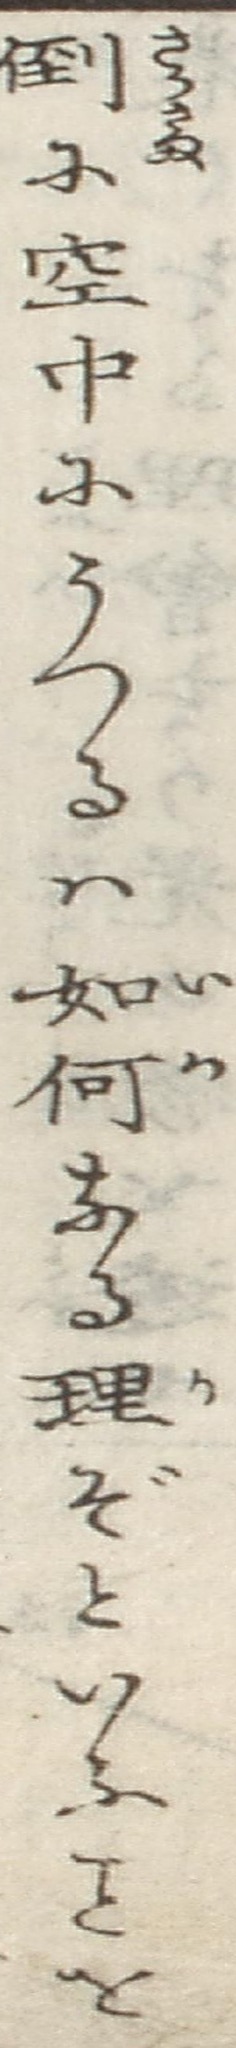倒に空中にうつるは如何なる理ぞといふことを
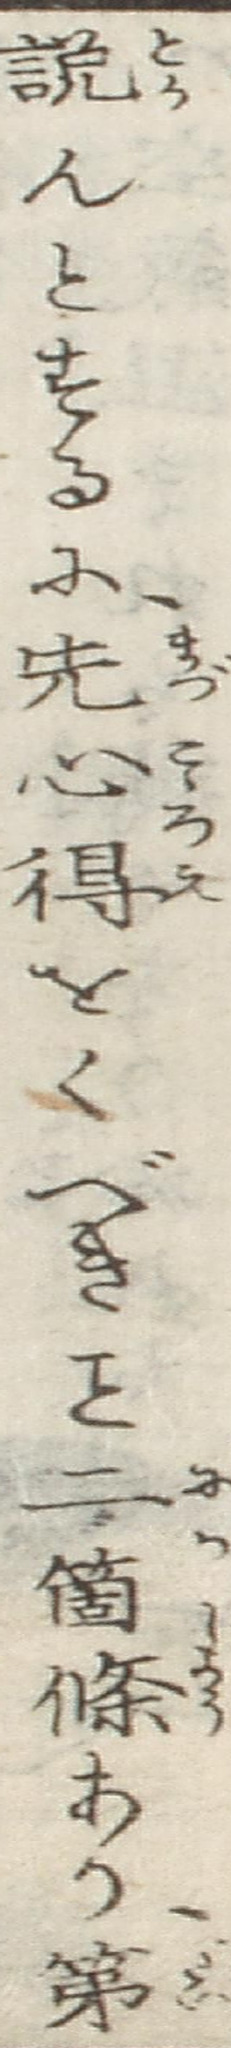説んとするに、先心得をくべきこと二箇条あり、第
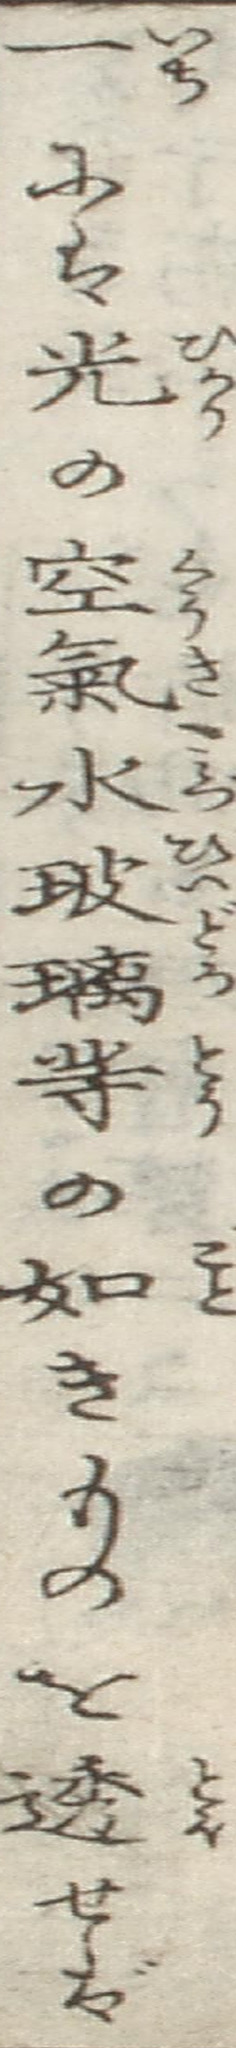一には光の空気、水玻瑠等の如きものを透せば

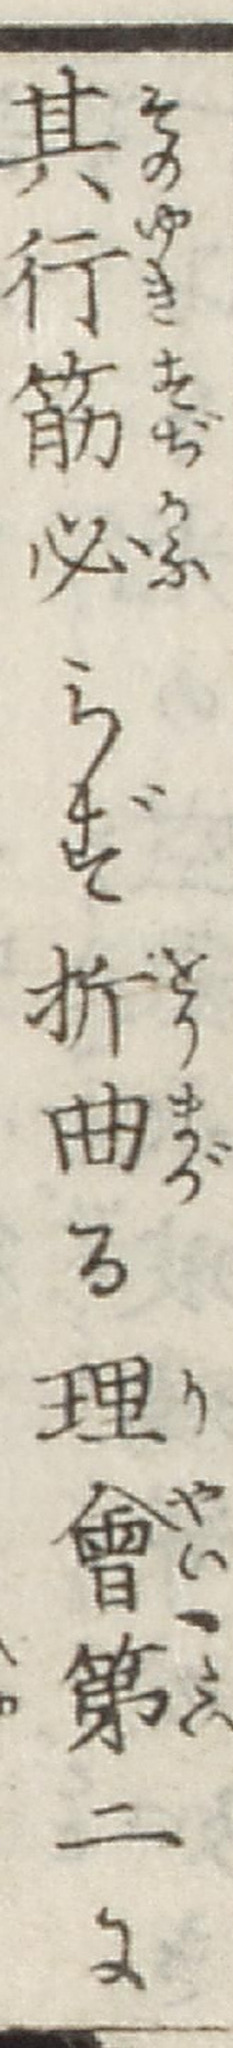其行筋必らず折曲る理会、第二に
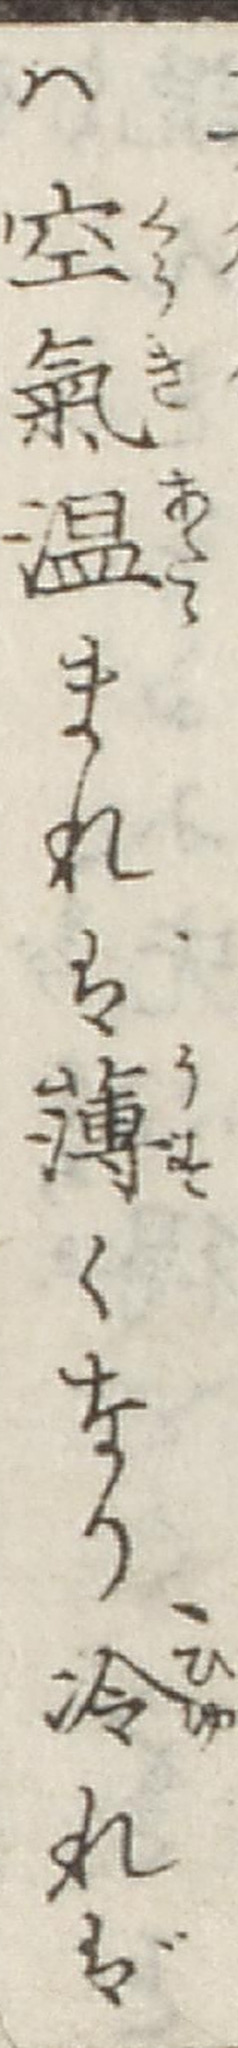は空気温まれは薄くなり、冷れば
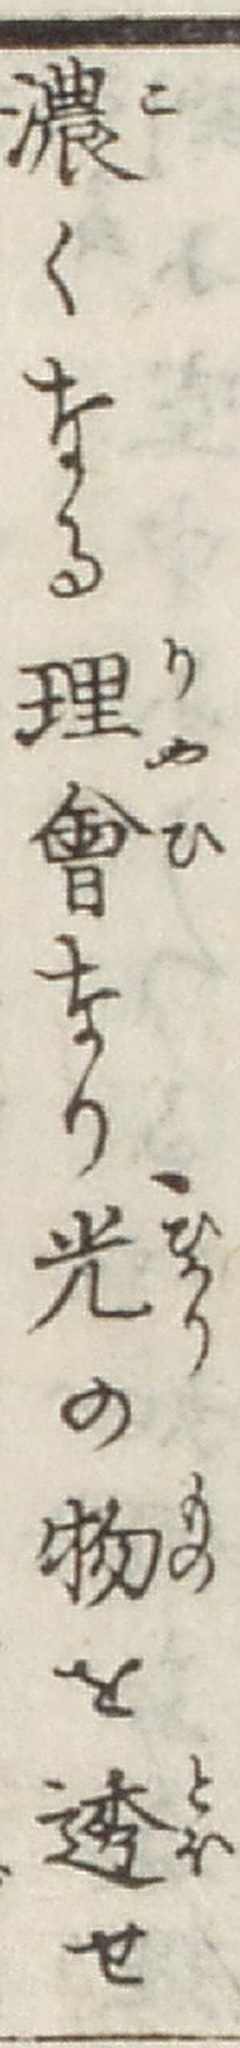濃くなる理会なり、光の物を透せ
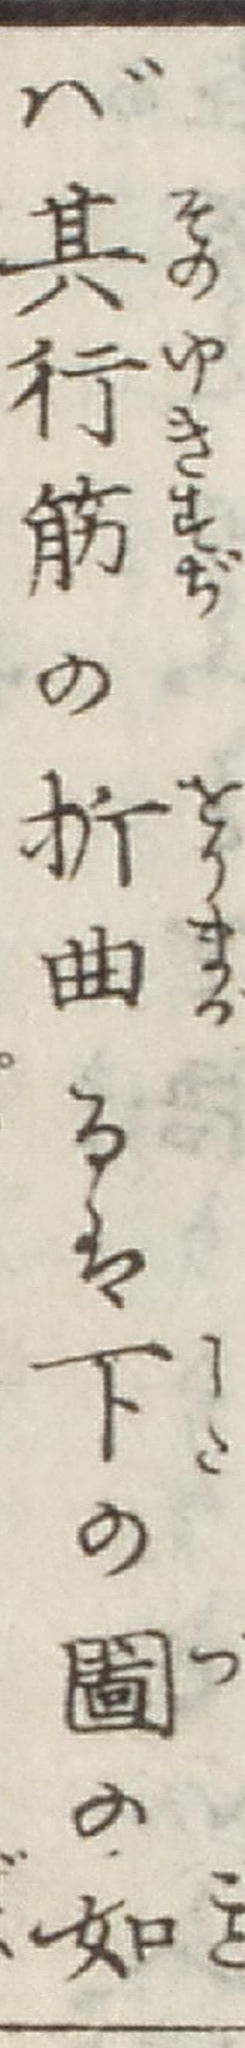ば其行筋の折曲るは下の図の如
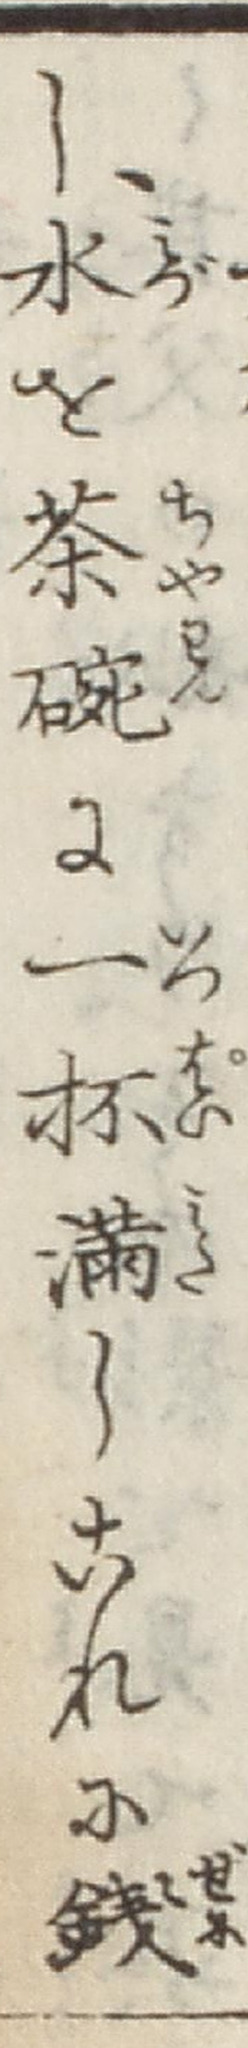し、水を茶碗に一杯満しこれに銭
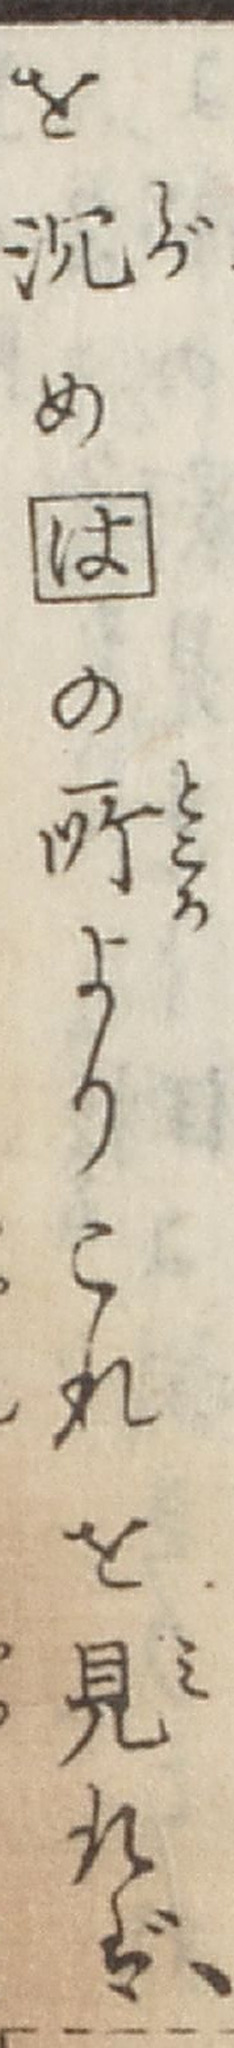を沈めはの所よりこれを見れば、
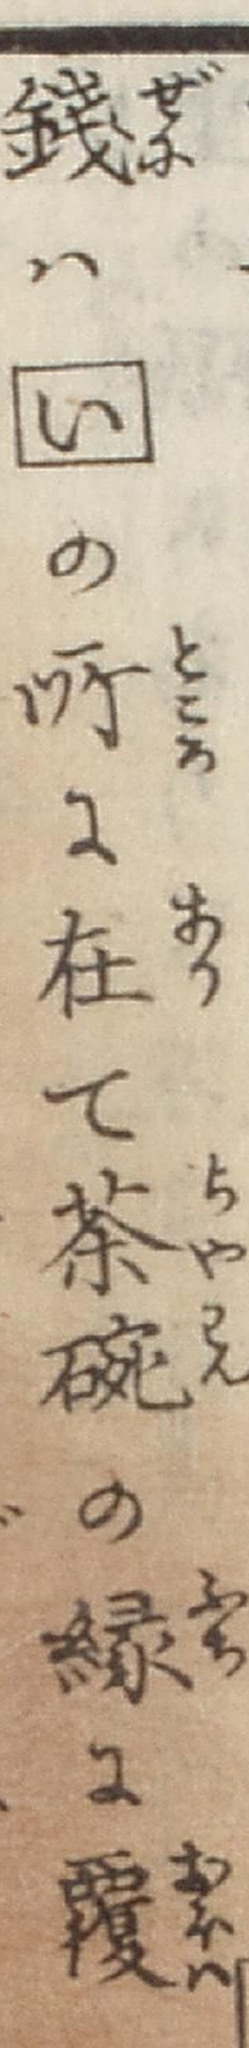銭はいの所に在て茶碗の縁に覆
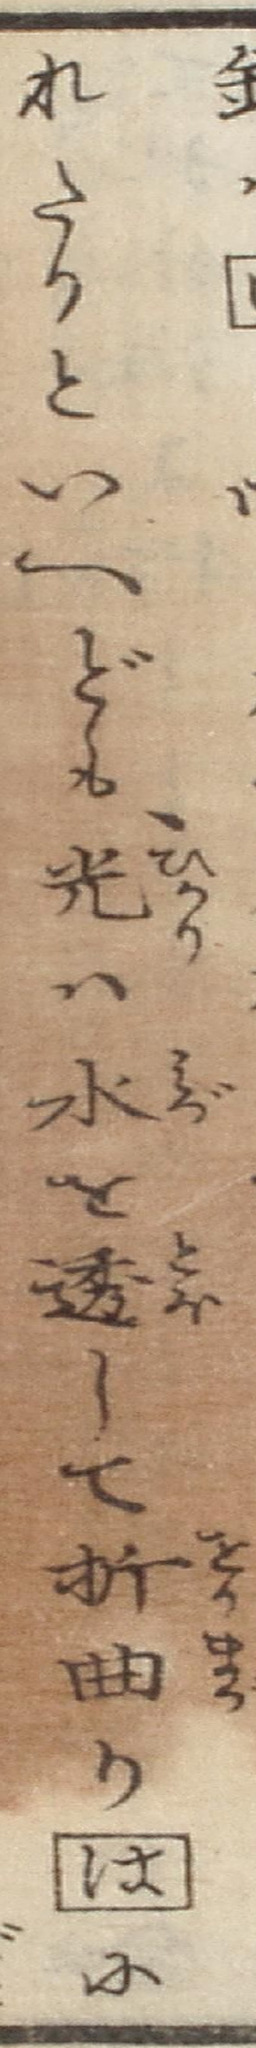れたりといへども、光は水を透して折曲りはに
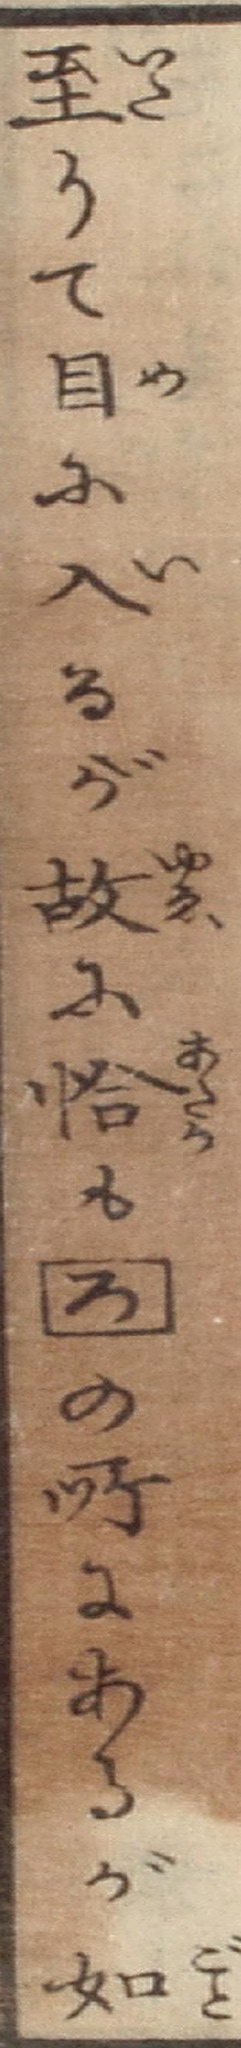至りて目に入るが故に恰もろの所にあるが如
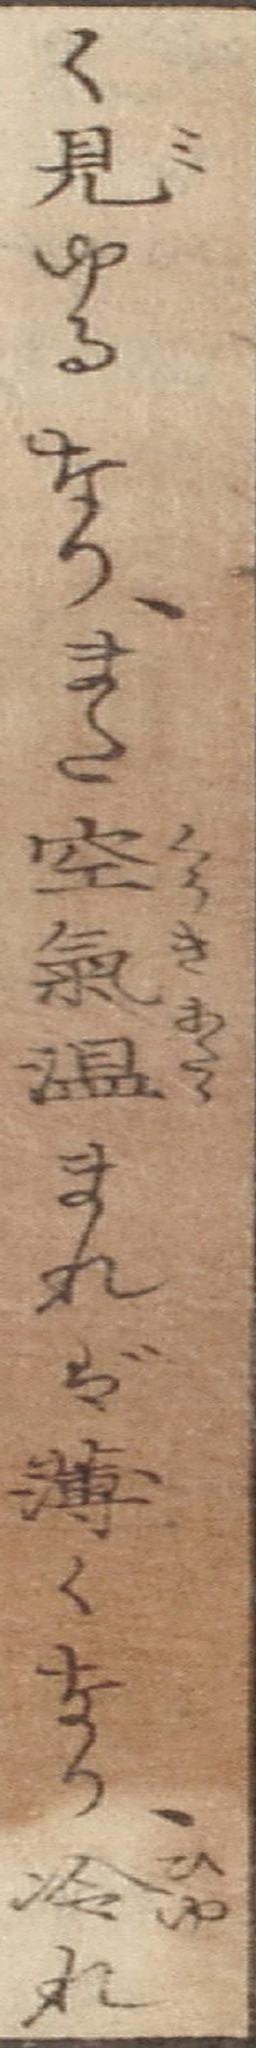く見ゆるなり、また空気温まれば薄くなり、冷れ
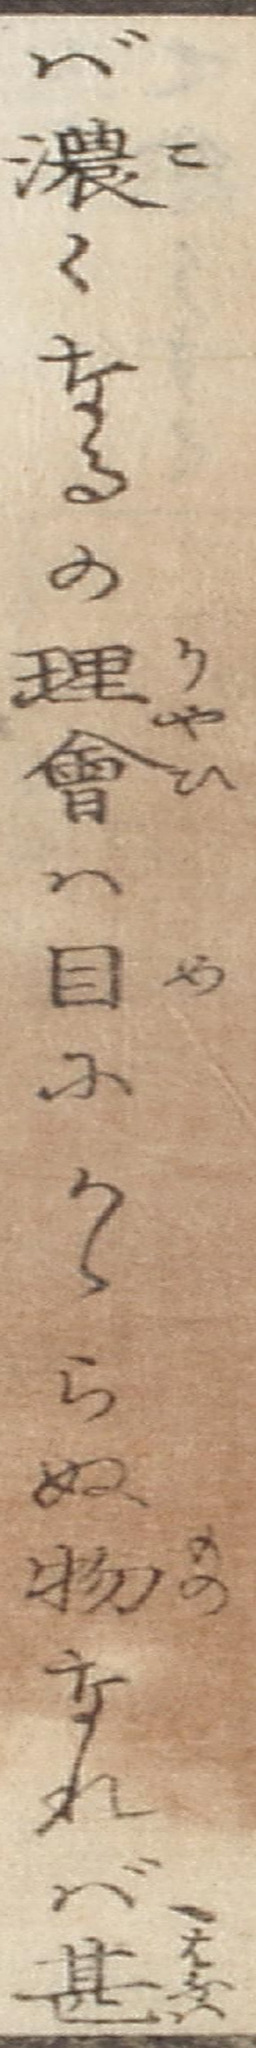ば濃くなるの理会は目にかゝらぬ物なれば、甚
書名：変異辯　一名、天變地異拾遺　全
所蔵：東京大学地震研究所図書室 Earthquake Research Institute Library, The University of Tokyo, JAPAN
